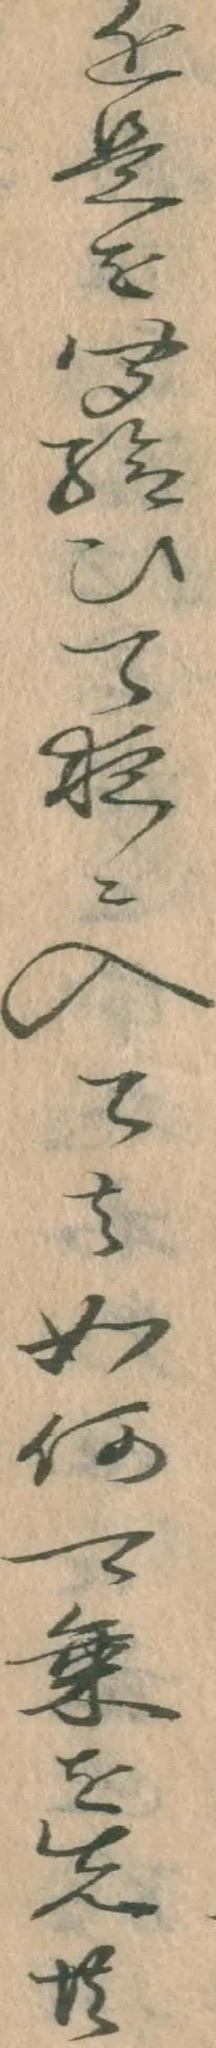近是を聞給ひて夜に入て者如何可乗を先共
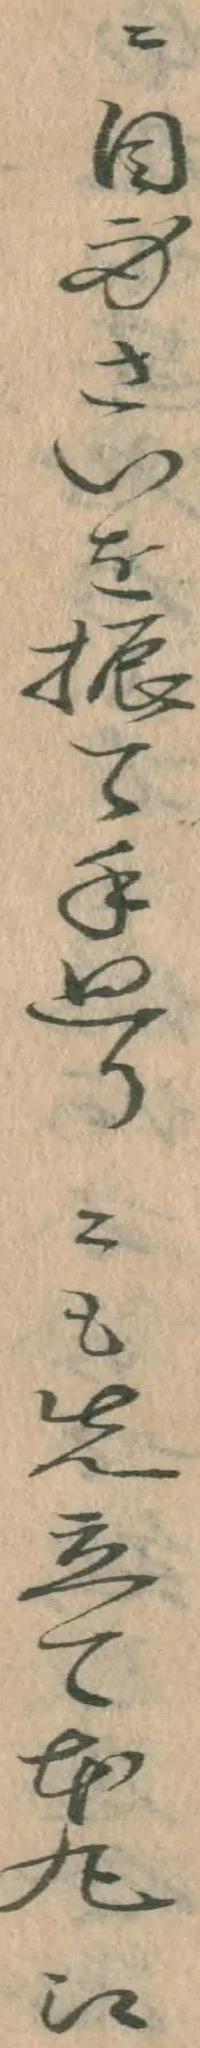に自身さいを振て手廻りにも先立て本丸江
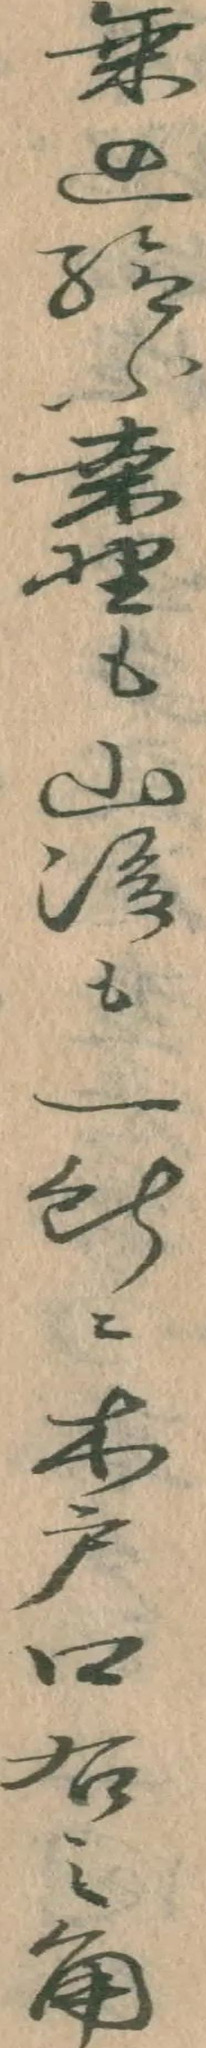乗込給ふ桑野も山後も一所に木戸口右之角
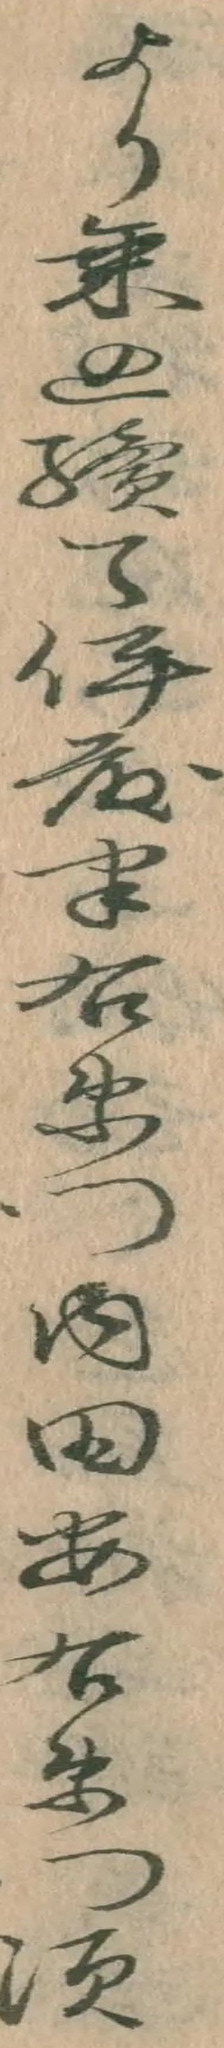より乗込続て伊藤半右衛門内田安右衛門須
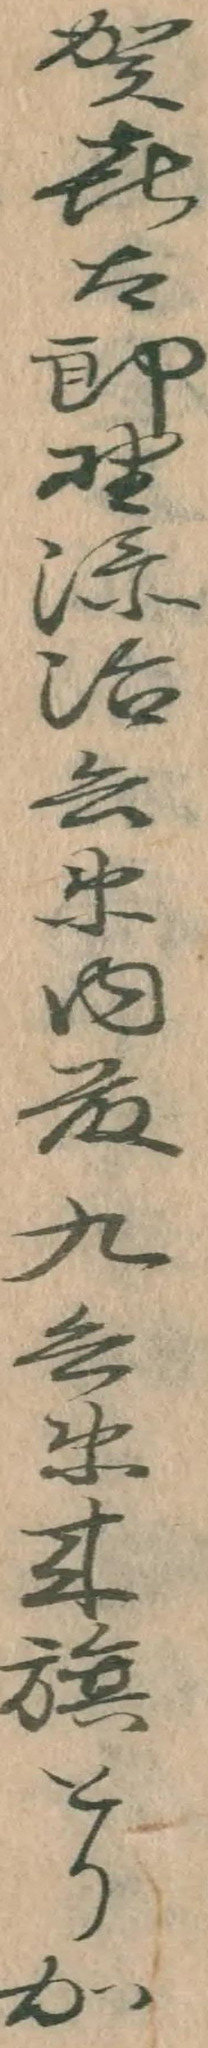賀喜太郎野添治兵衛内藤九兵衛来旗とり加
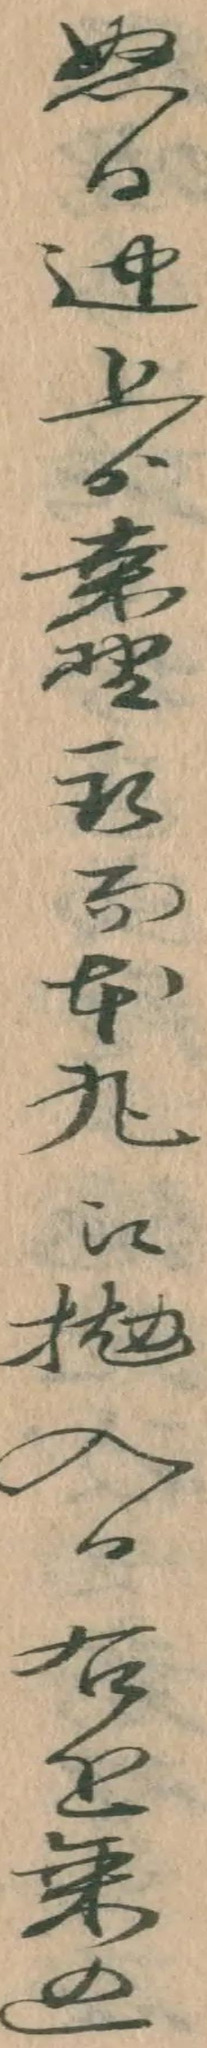怒る迚上ゟ桑野取而本丸江抛入る右近乗込
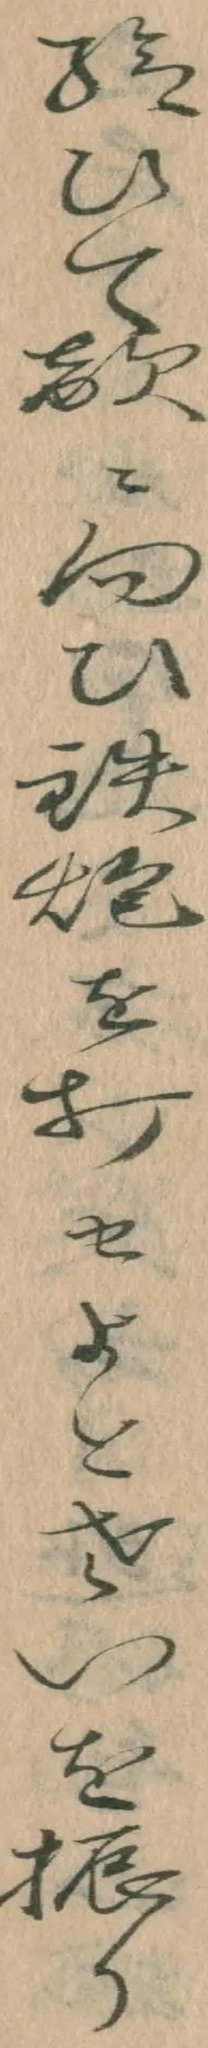給ひて敵に向ひ鉄砲を打せよとさいを振り
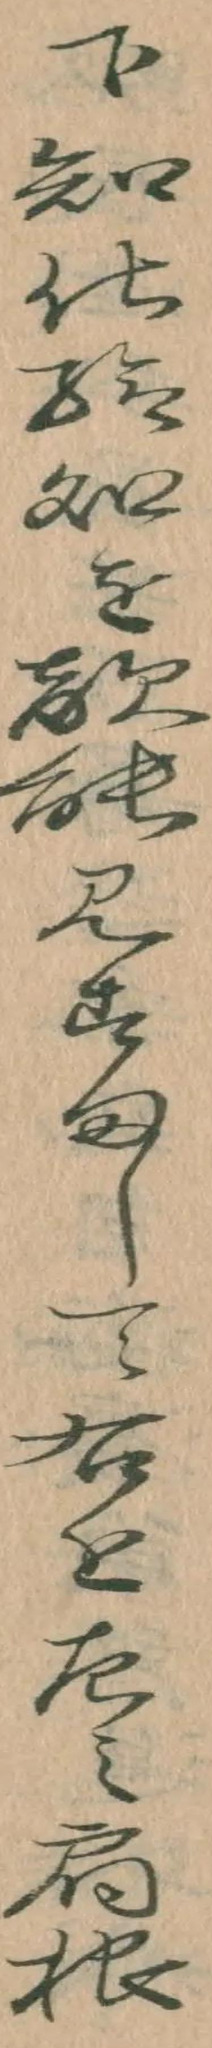下知仕給処を敵能見春まして右近左之肩根
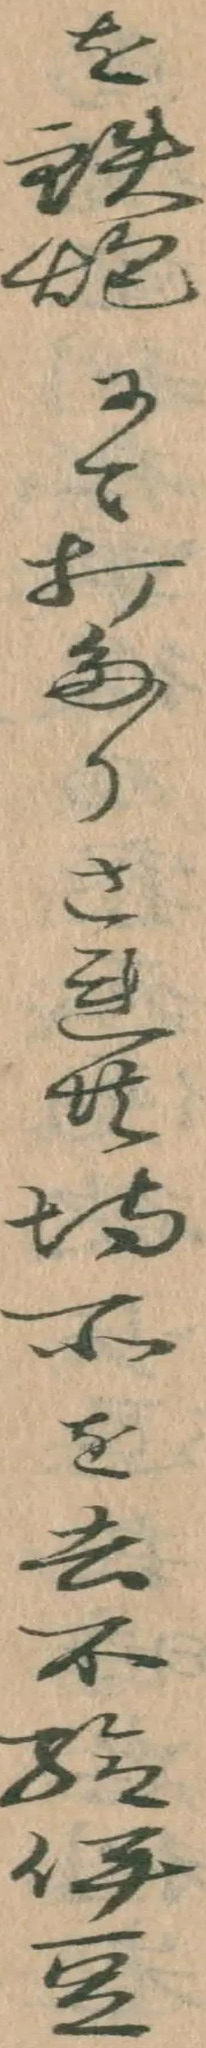を鉄砲尓て打多りさ連共場所を去不給伊豆
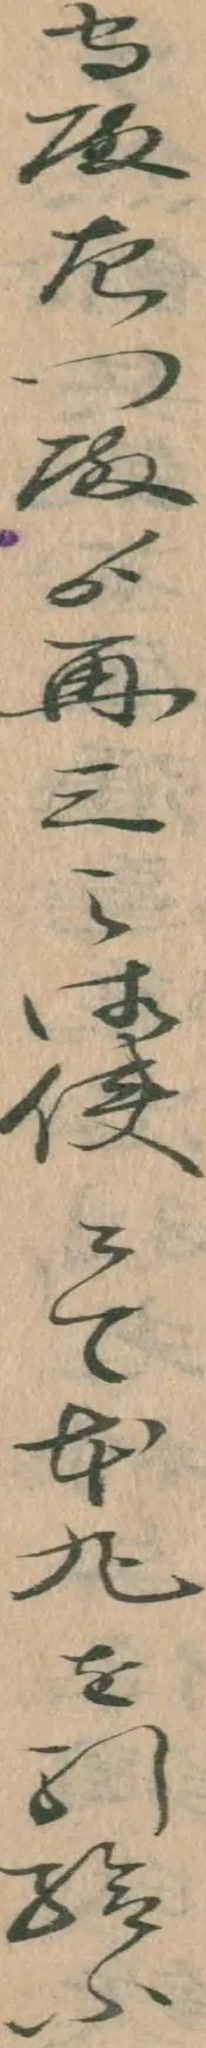守殿左門殿ゟ再三之御使にて本丸を引給ふ
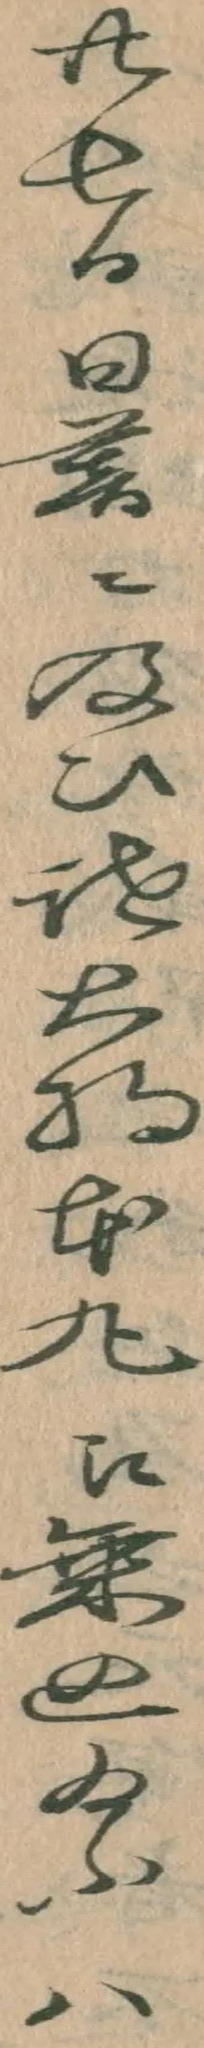廿七日日暮に及ひ諸大将本丸江乗込ゐふは
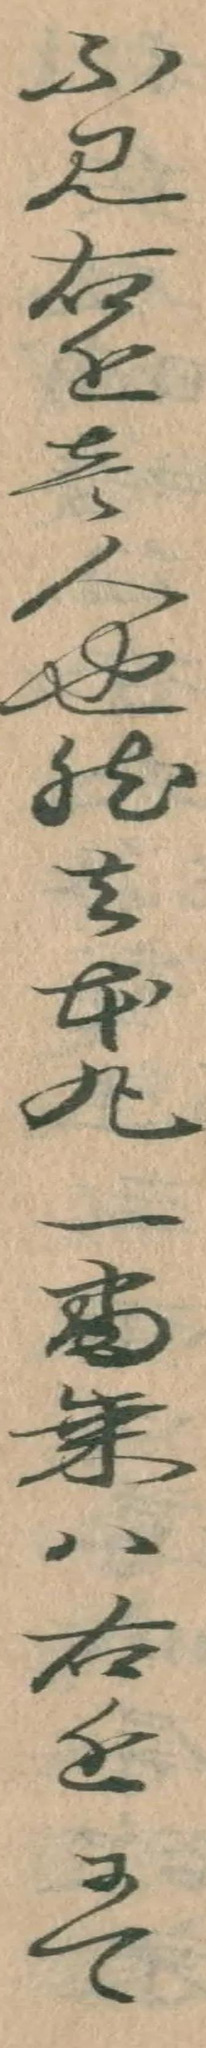ふ見右近壱人也然者本丸一番乗は右近尓て
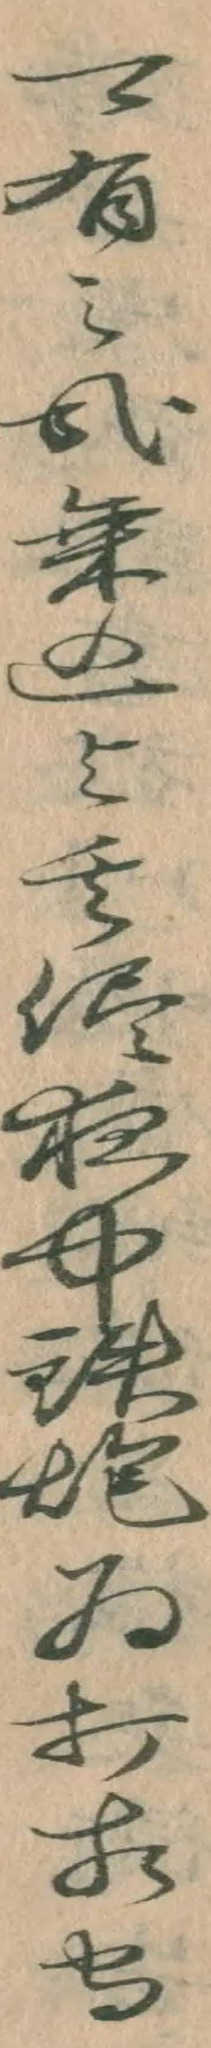可有之哉乗込与其侭夜中鉄砲ゐ打相守
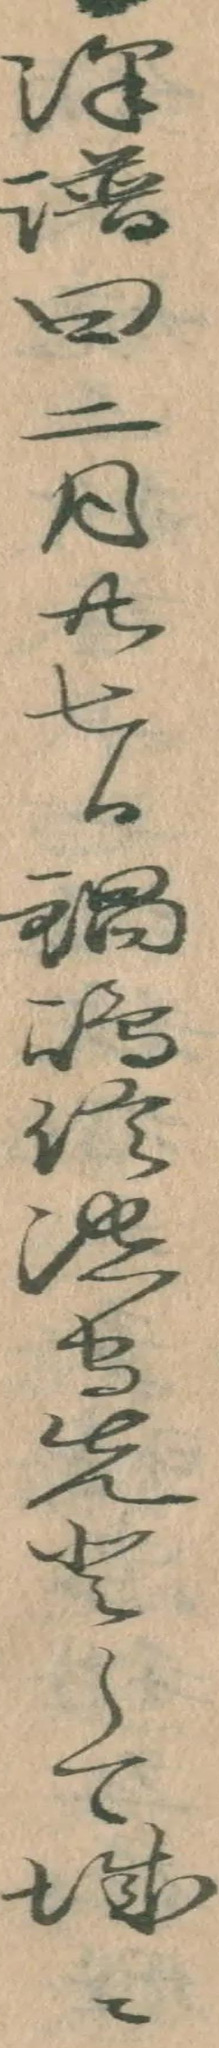寺沢譜曰二月廿七日鍋島信濃守先登して城に
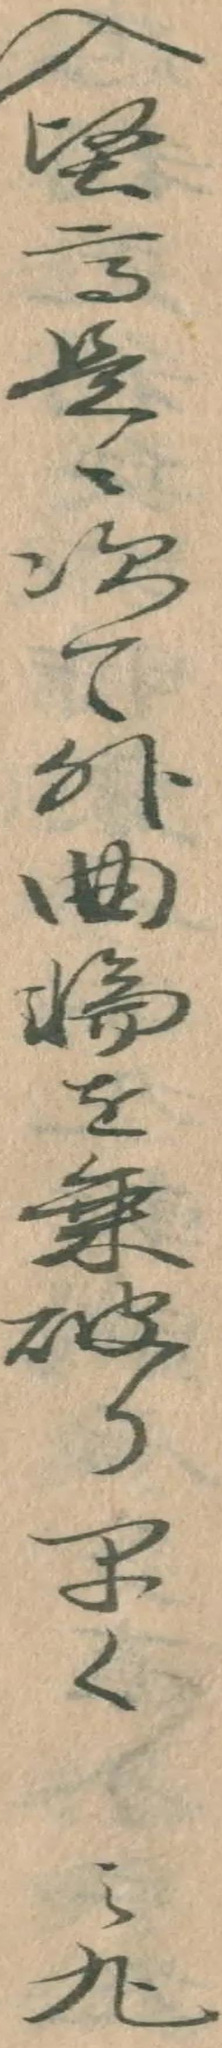入堅高是に次て外曲輪を乗破り早く〱之丸
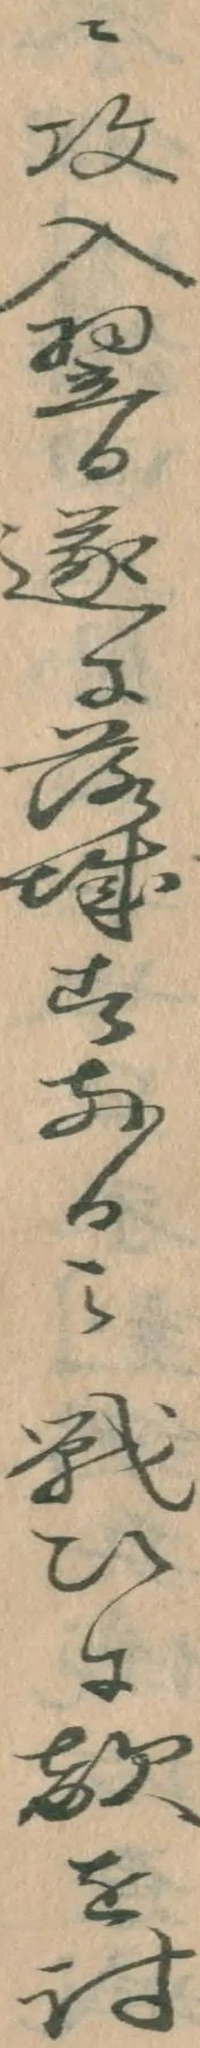に攻入翌日遂尓落城春なる之戦ひ尓敵を討
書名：切支丹御退治記 49巻. [8]
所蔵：国立国会図書館 National Diet Library, JAPAN
